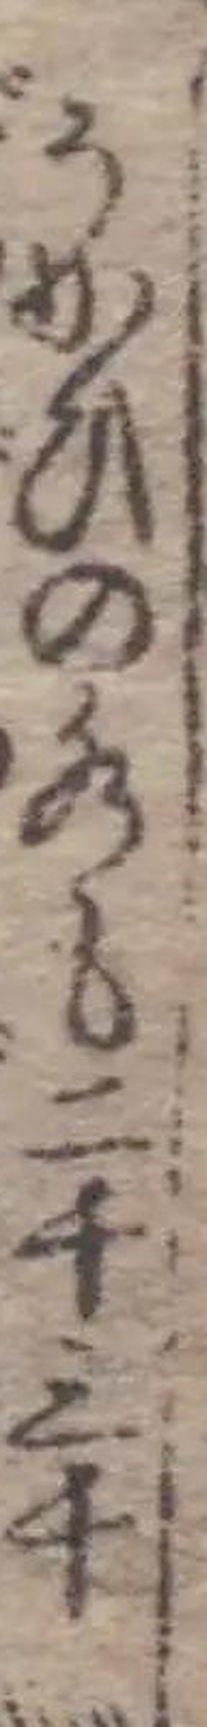うかひの水も二千三千
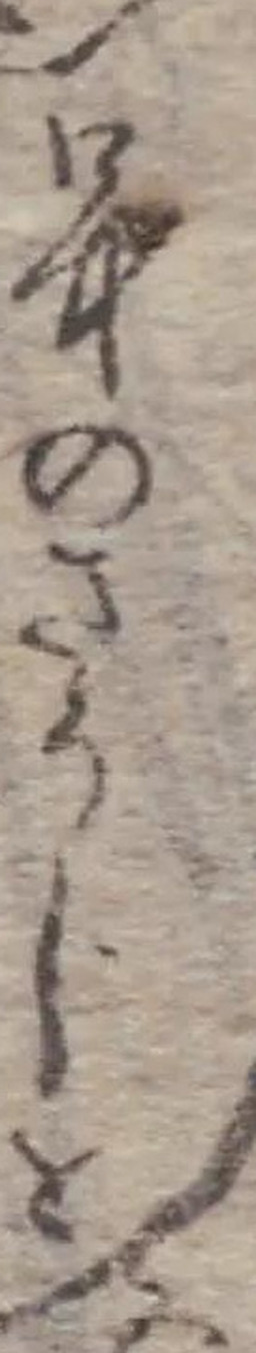口中のさうじを
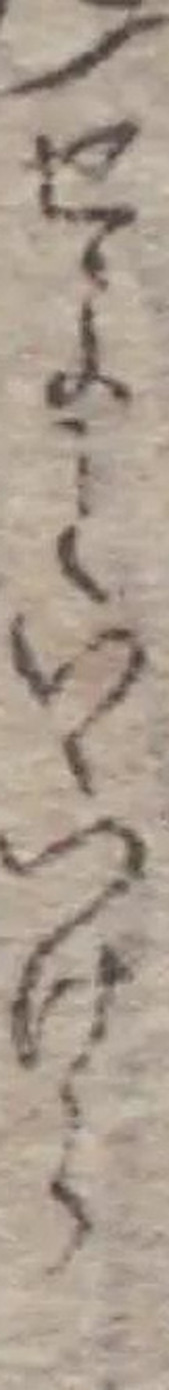せよといゝつけら
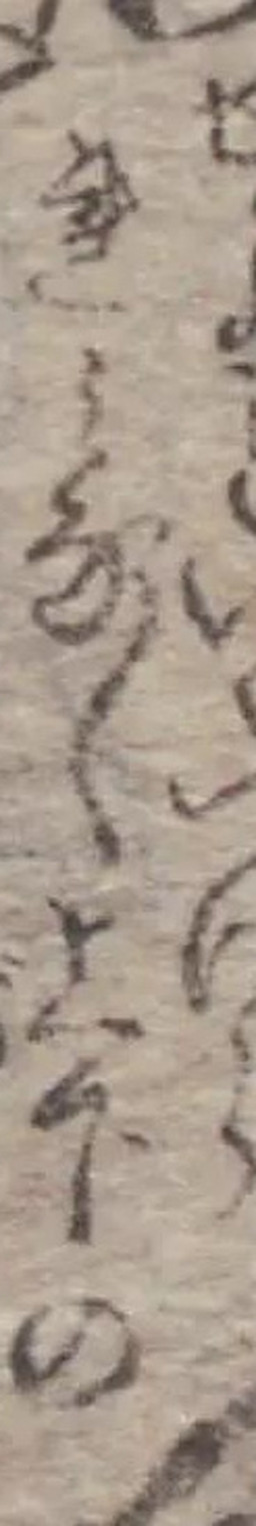れみな〳〵上下の
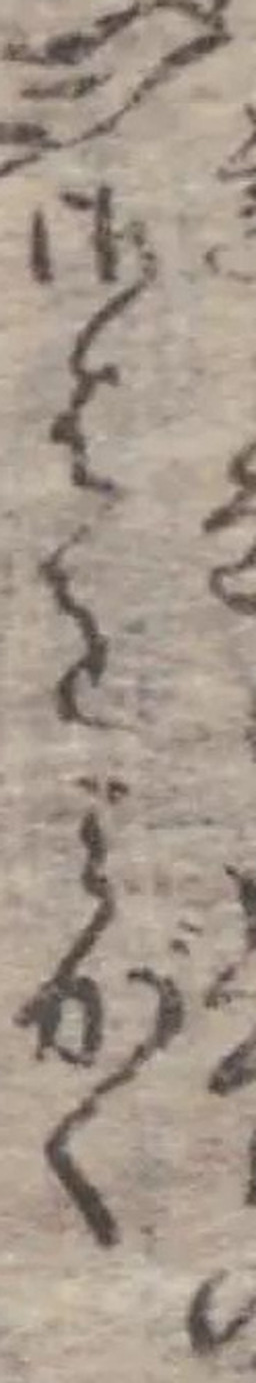御はをみがく
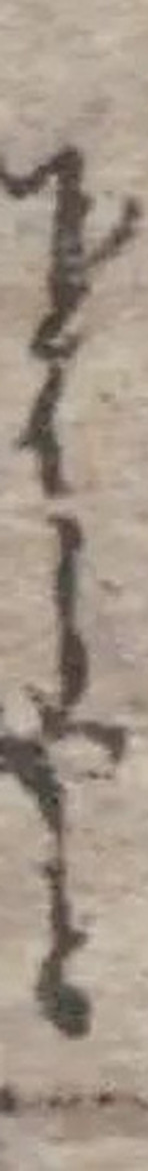下はしやと
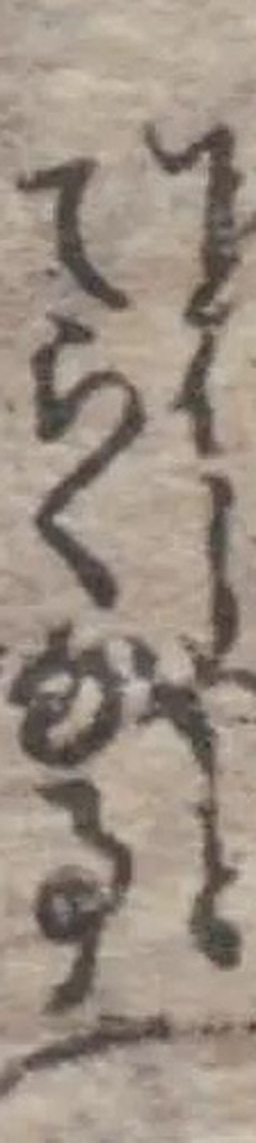てらくな事
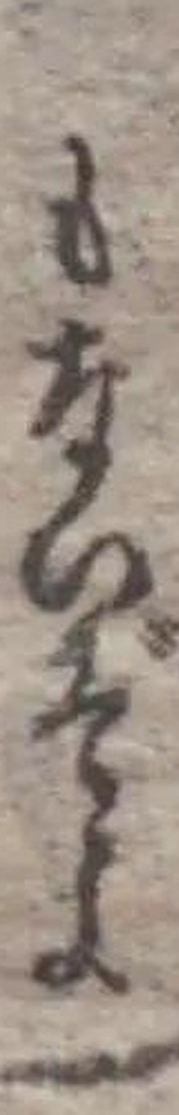もないぞよ
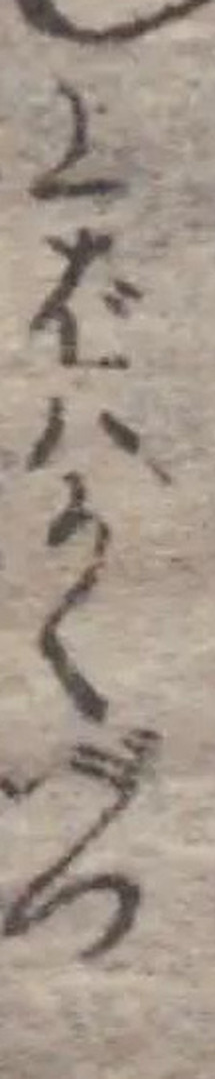上ばはかくべつ
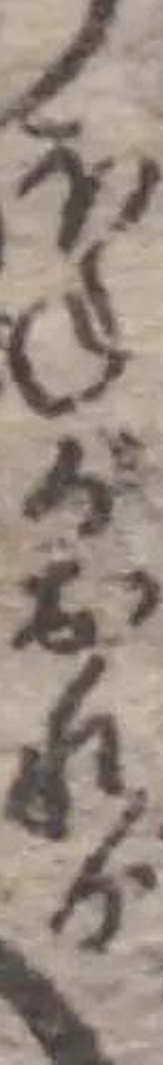ほねがおれる
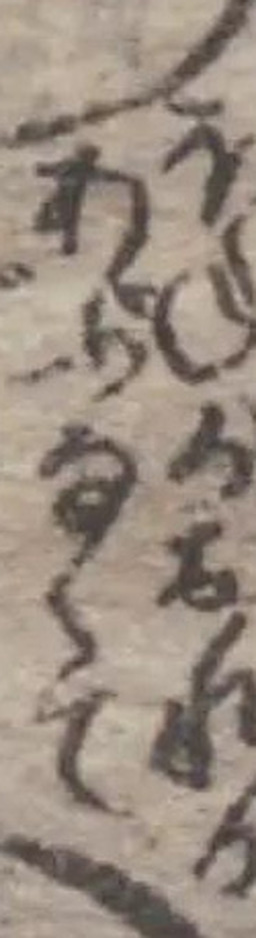あぶなくて
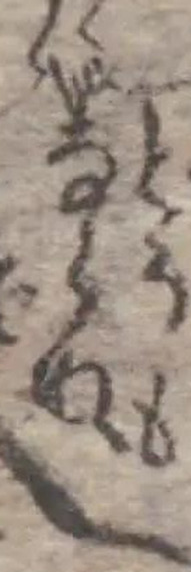ならぬ
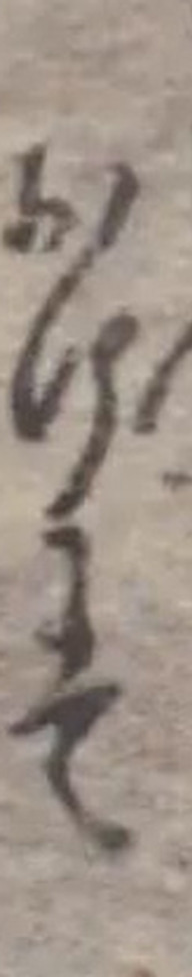おけにて
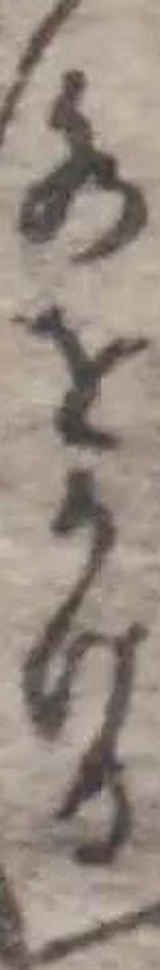水をうける
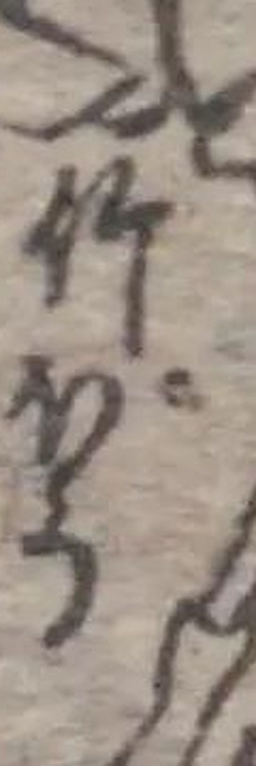竹ぼう
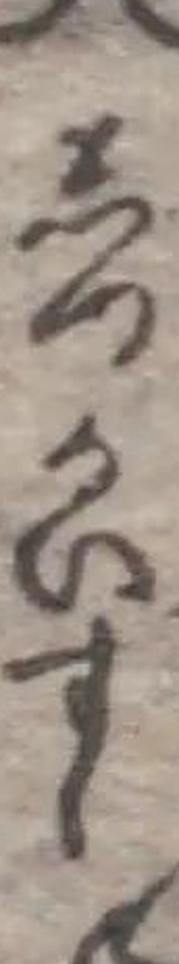しつかいすゝ
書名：五たいそう
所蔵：国立国会図書館 National Diet Library, JAPAN
